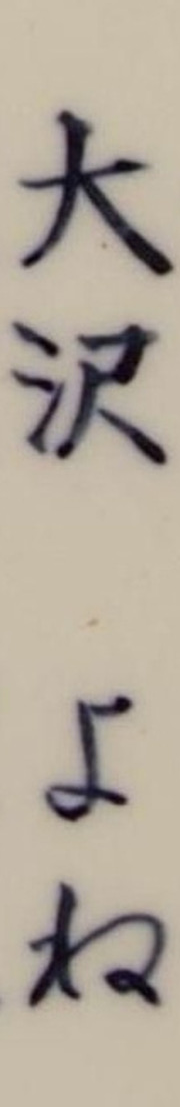大沢よね
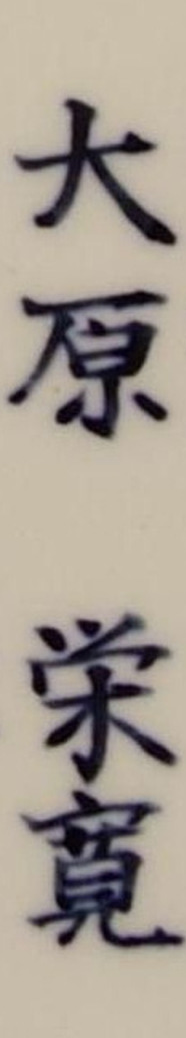大原栄寛
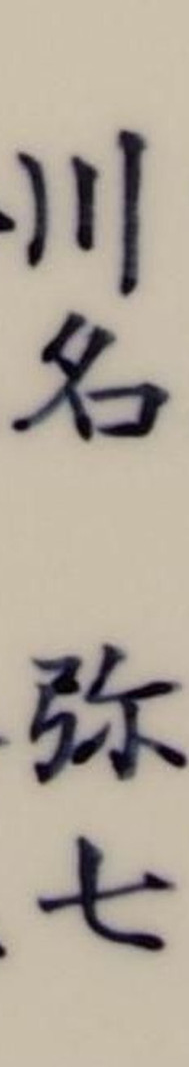川名弥七
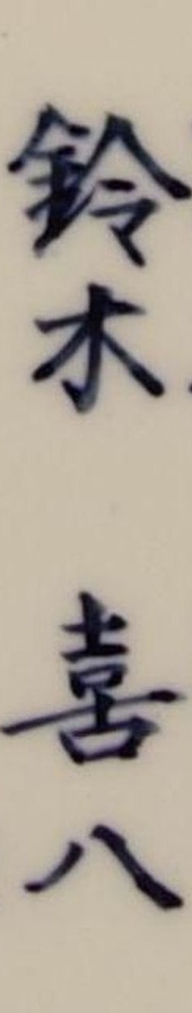鈴木喜八
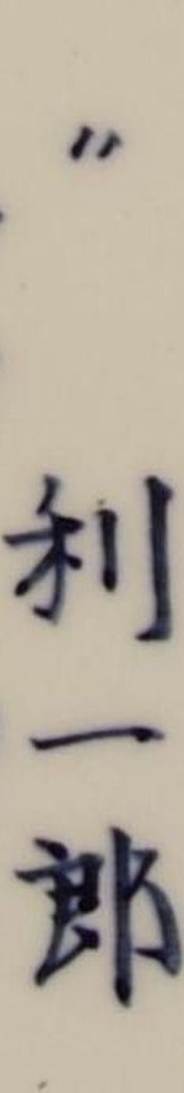利一郎
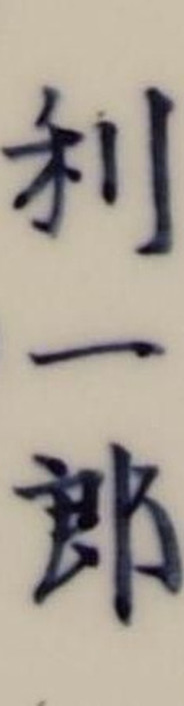利一郎
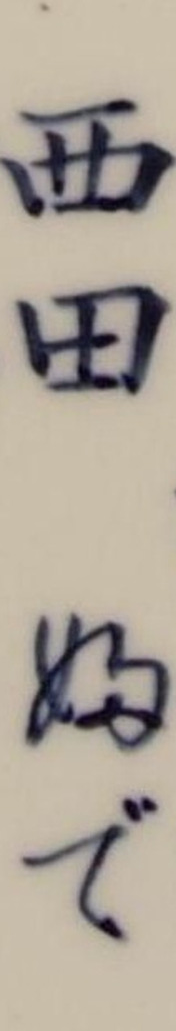西田ふで
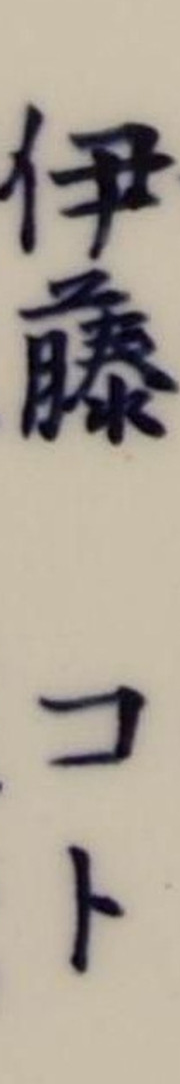伊藤コト
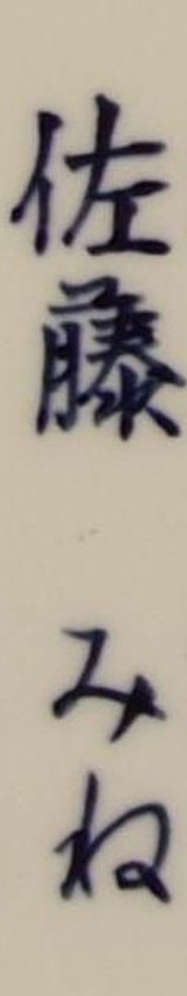佐藤みね
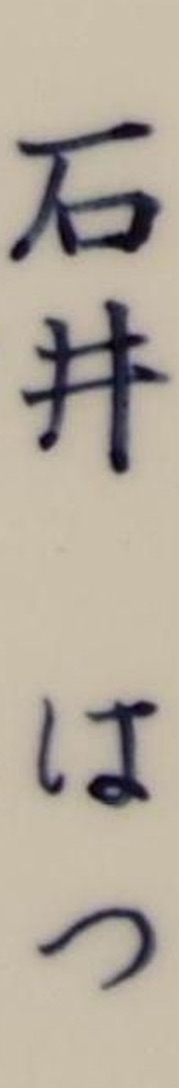石井はつ
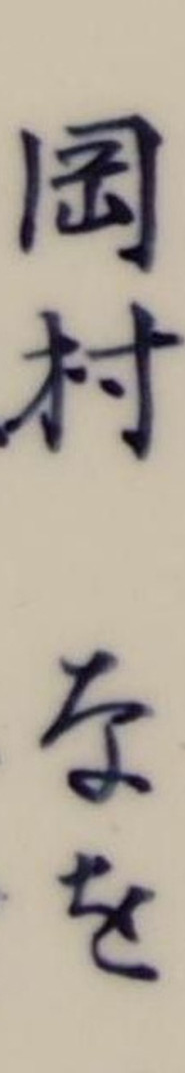岡村なを
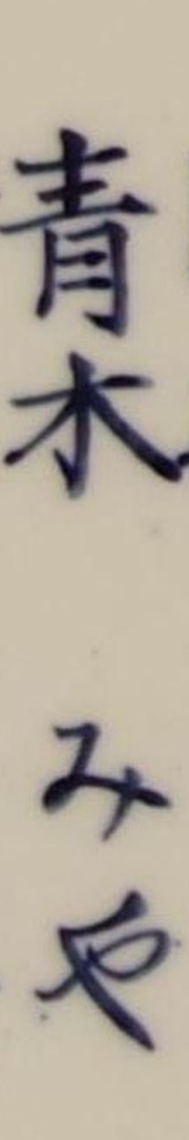青木みや

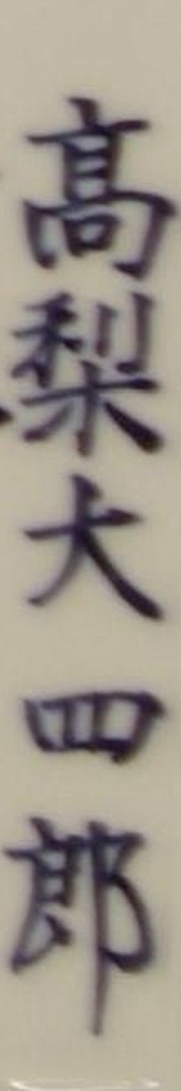高梨大四郎
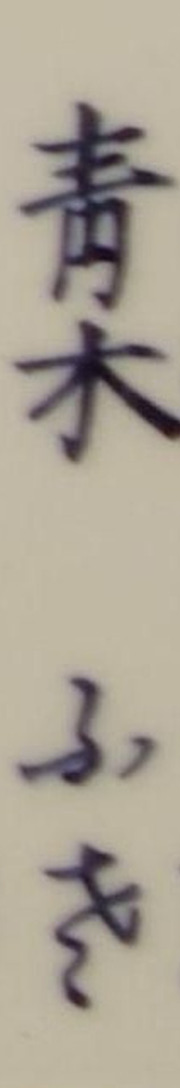青木ふさ
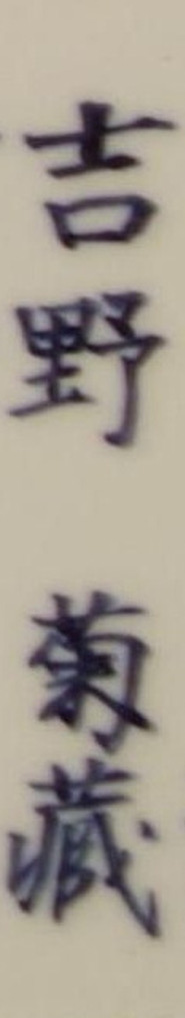吉野菊蔵
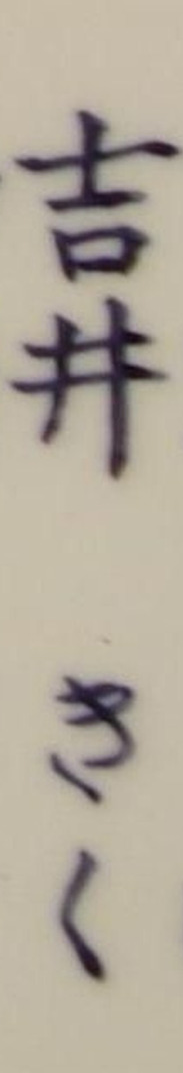吉井きく
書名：E~L
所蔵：高野山金剛峯寺
